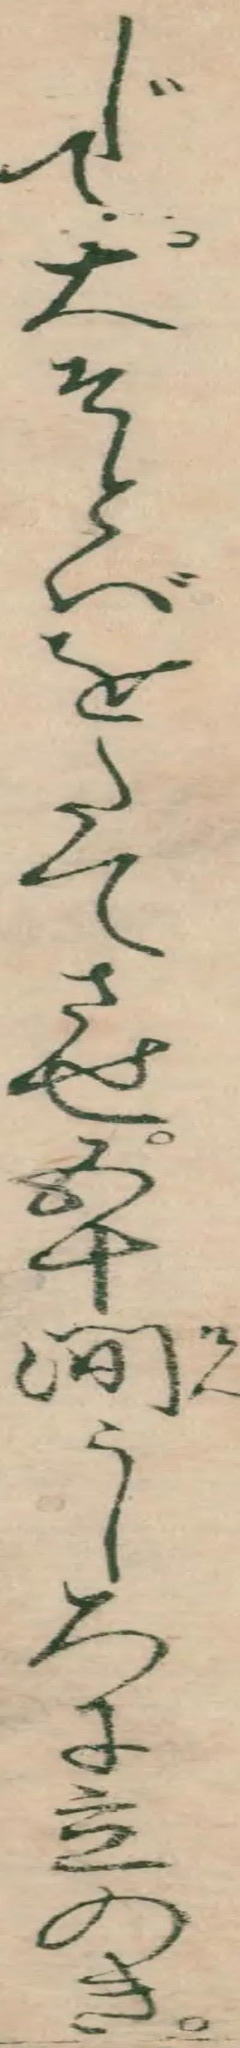じて。大そとばをたてさせ。五十間うしろに立のき。
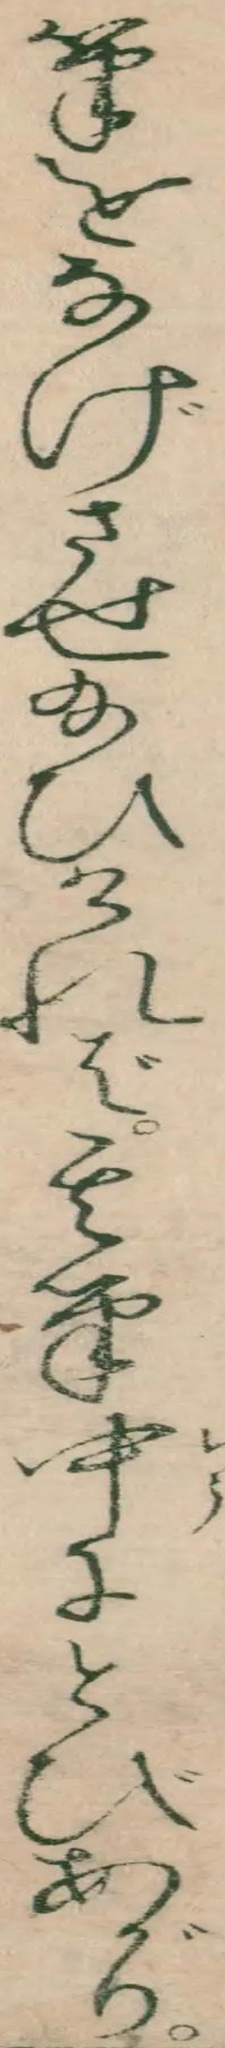筆をなげさせ給ひければ。其筆中にとびあがり。
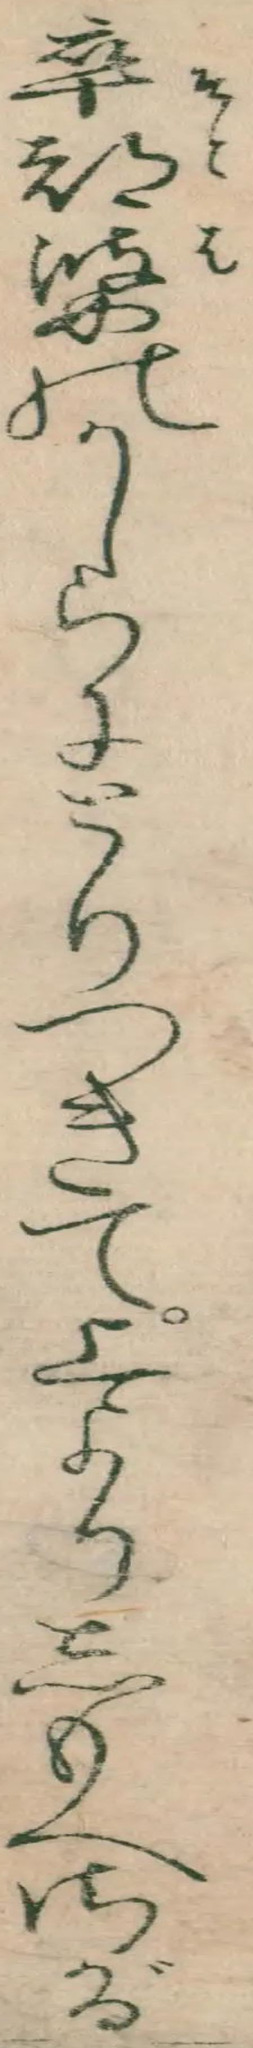卒塔婆のかしらにとりつきて。上よりしもへさがる
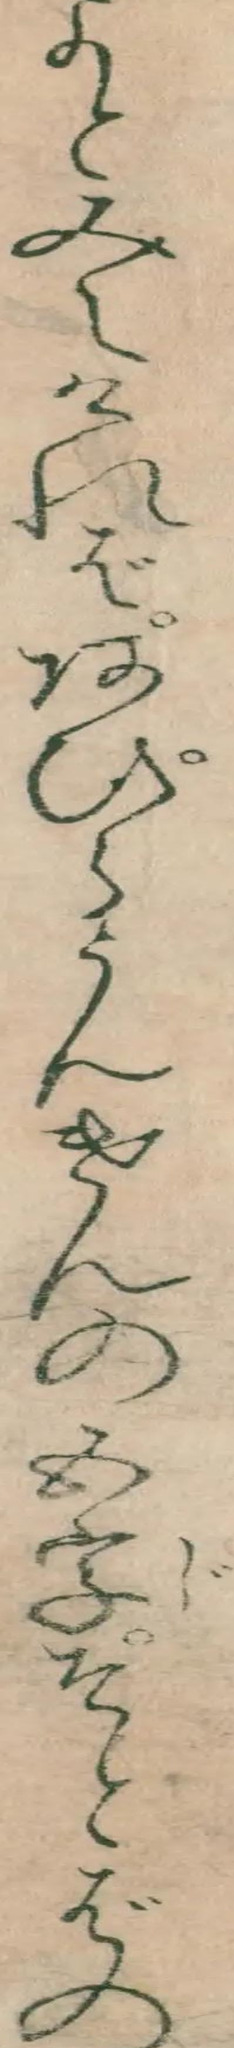よとみえければ。あぴらうんけんの五字。そとばの
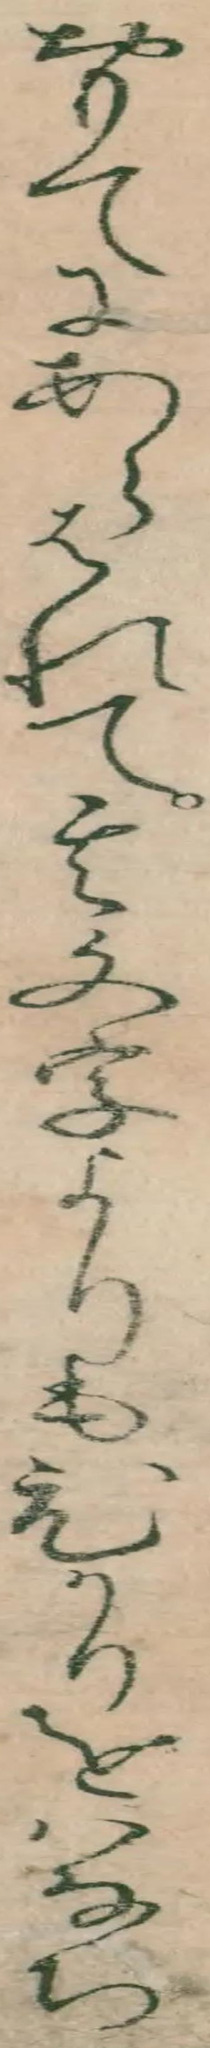おもてにあらはれて。其文字よりもひかりをはなち
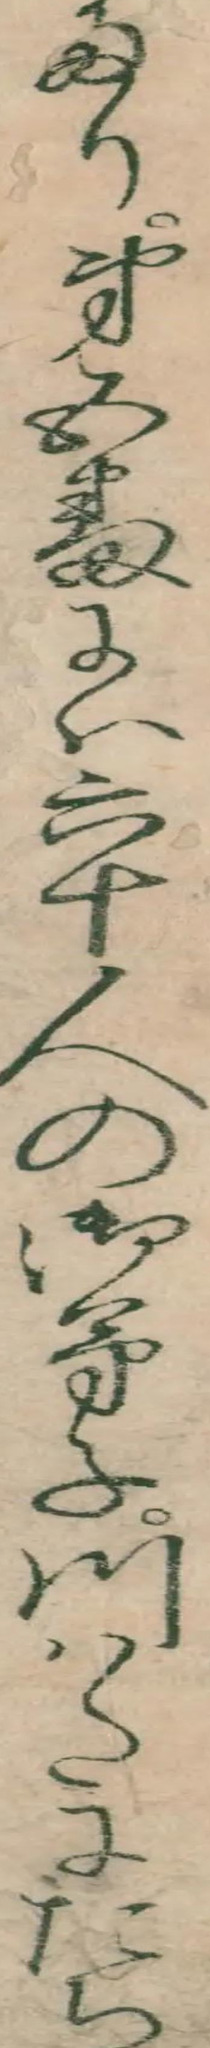たり。第五番には六十人の御弟子。川はたにたち

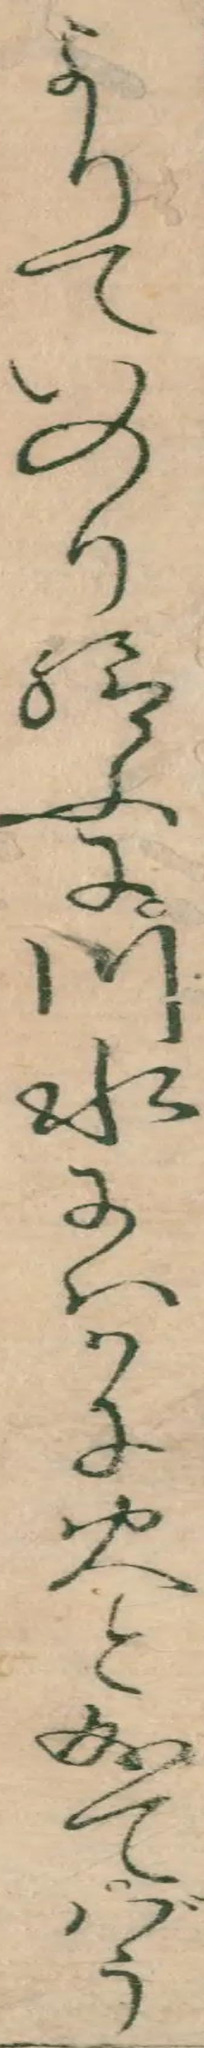よりていのり給ふに。川水にはかに火と成て。ばう
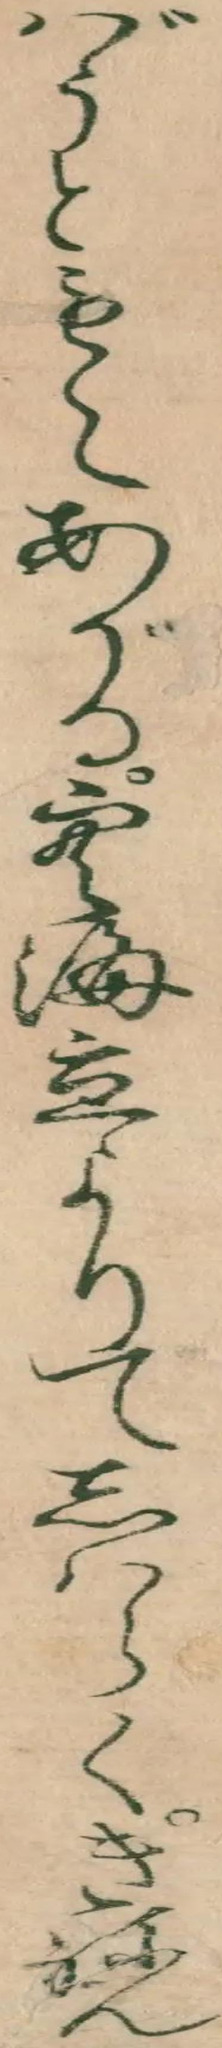ばうともえあがる。空海立よりてしはらく。きねん
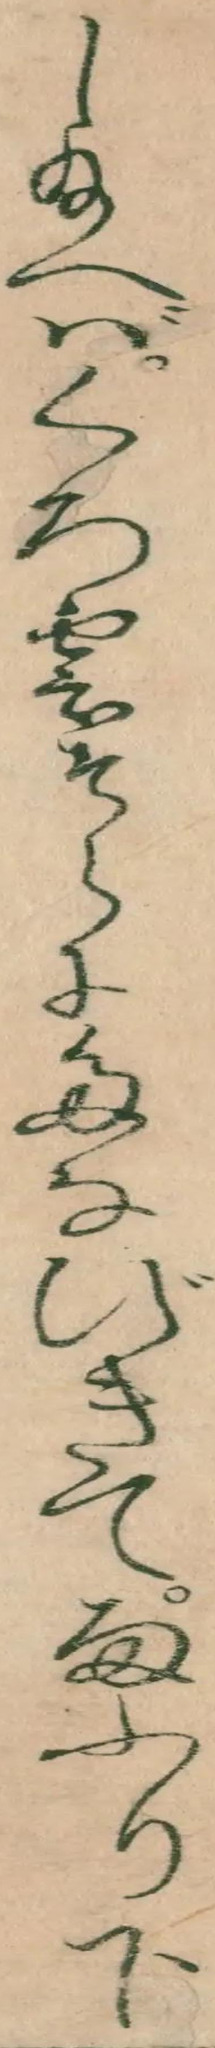し給へば。くろ雲そらにたなびきて。雨ふり下
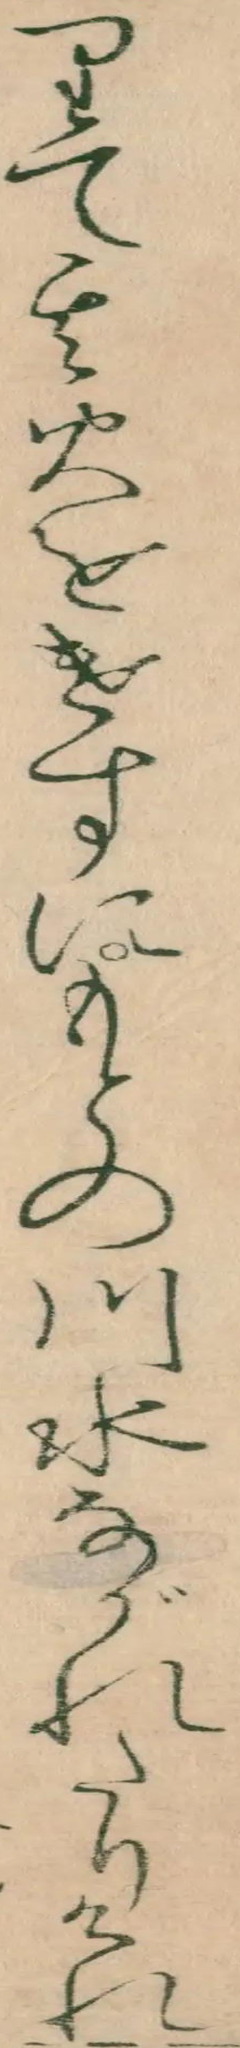りて其火をけすに。もとの川水ながれたりけれ
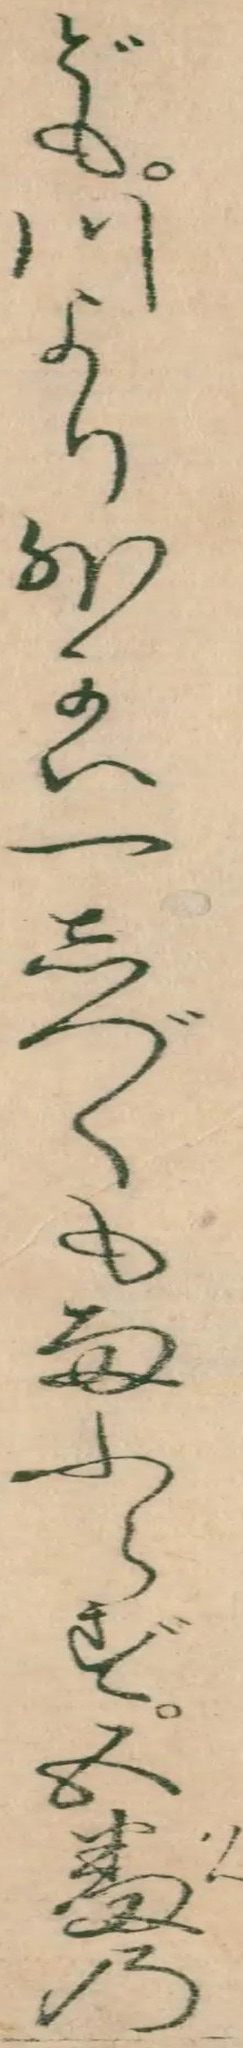ども。川より外には一しづくも雨ふらず。五番の
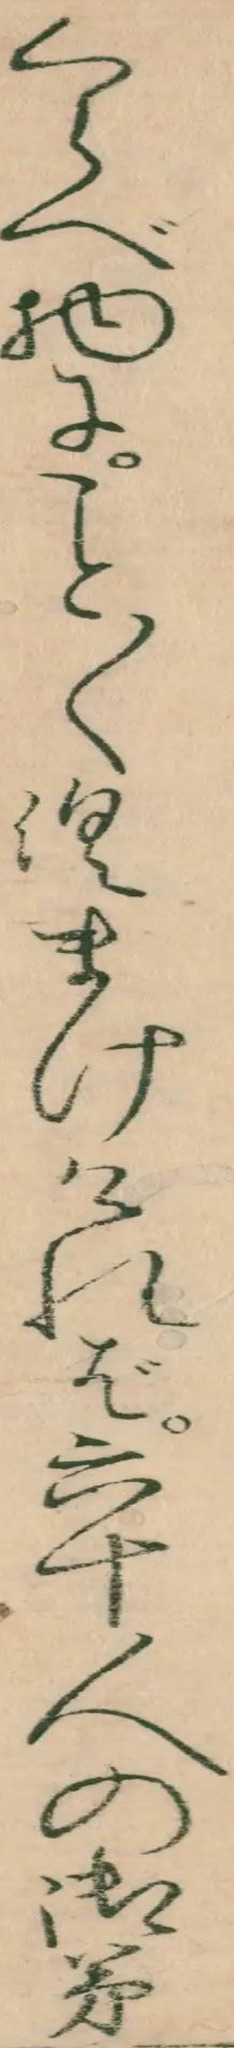くらべ物に。こと〳〵くまけければ。六十人の御弟
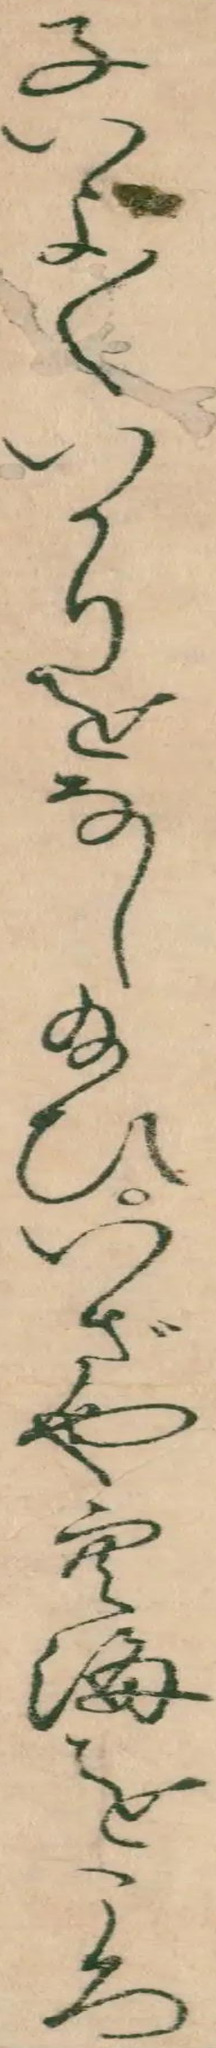子いよ〳〵いかりをなし給ひ。いざや空海をころ
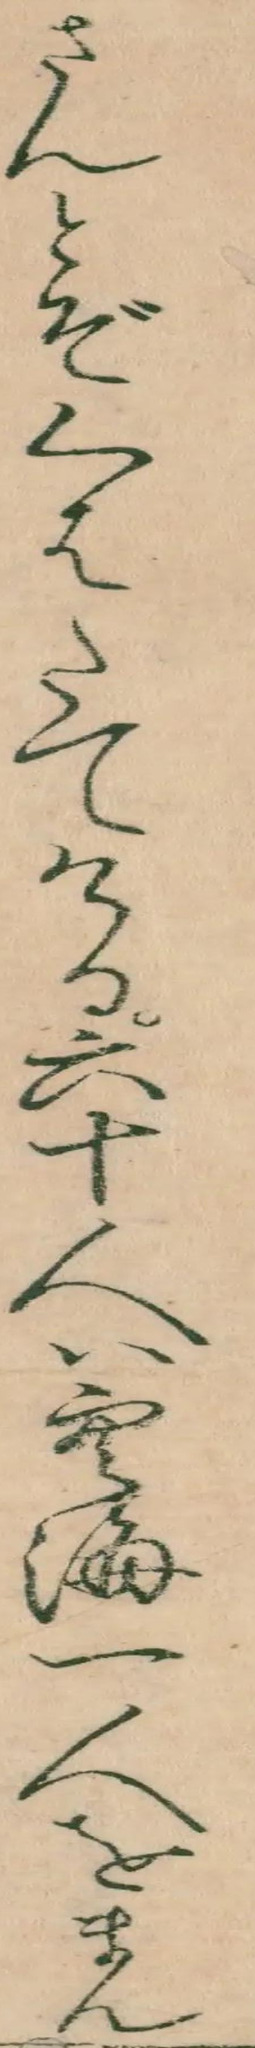さんとぞくはたてける。六十人は空海一人をまん
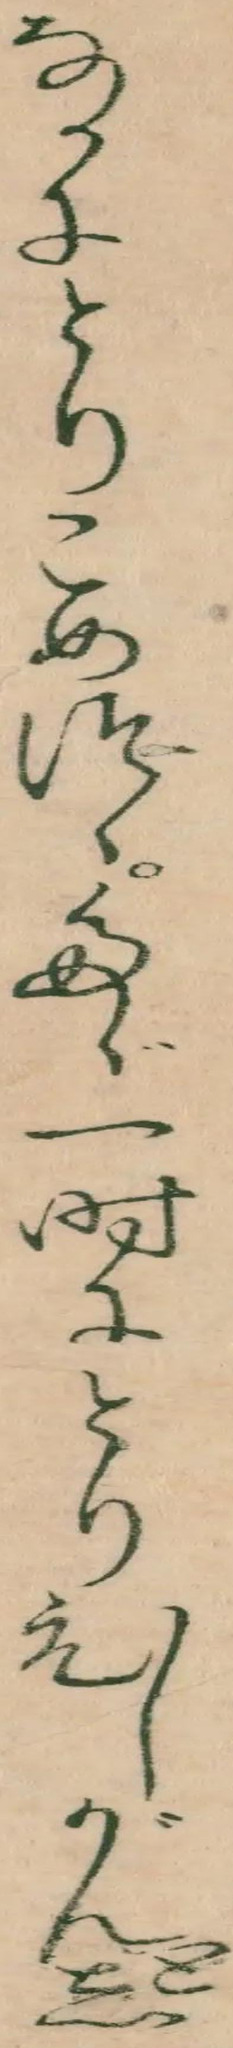なかにとりこめつゝ。たゞ一時にとりひしがんとし
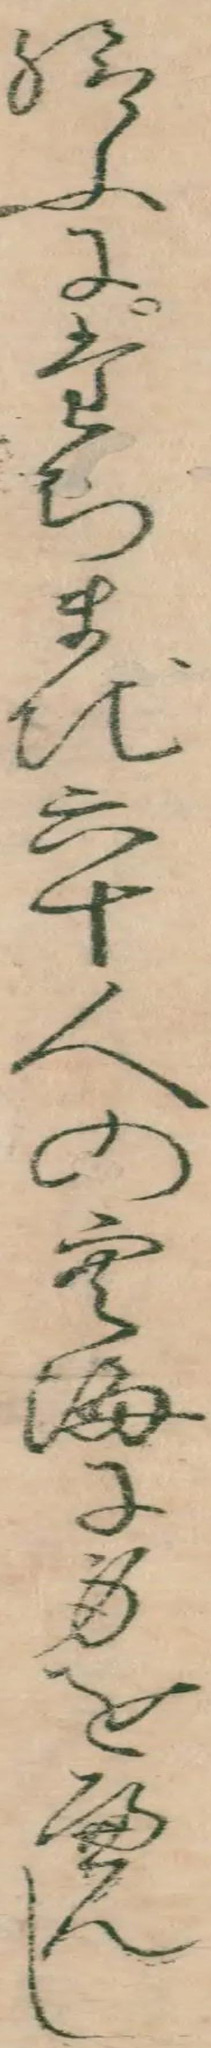給ふに。たちまち六十人の空海に身をへんし
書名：弘法大師御本地 3巻. [1]
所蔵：国立国会図書館 National Diet Library, JAPAN
